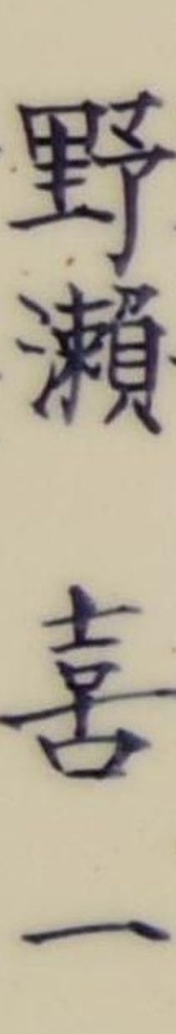野瀬喜一
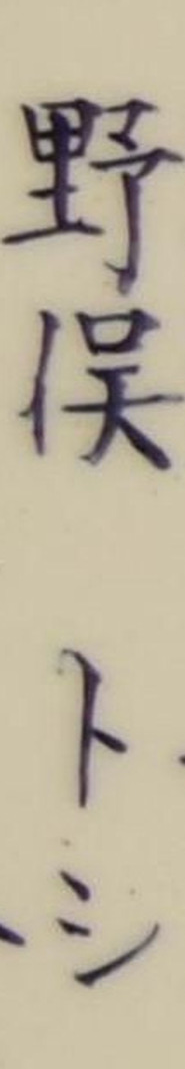野俣トシ

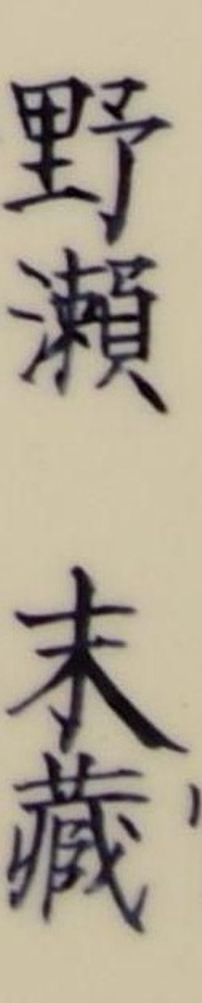野瀬末蔵
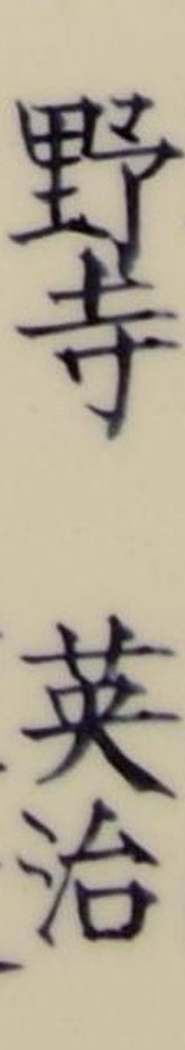野寺英治
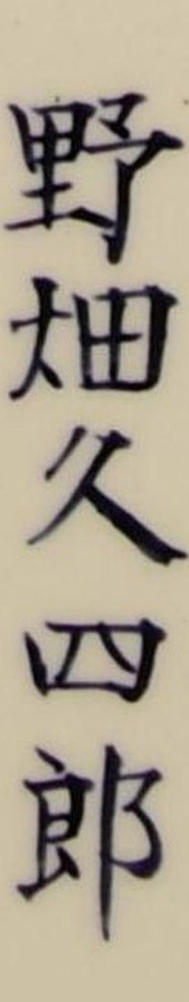野畑久四郎
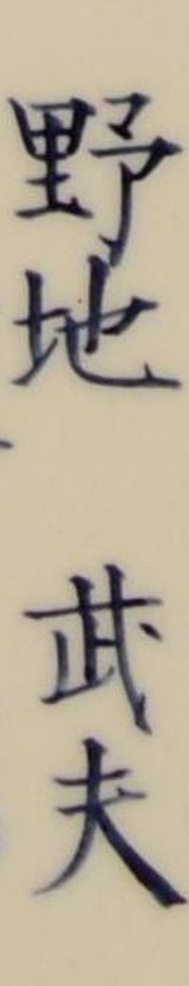野地武夫
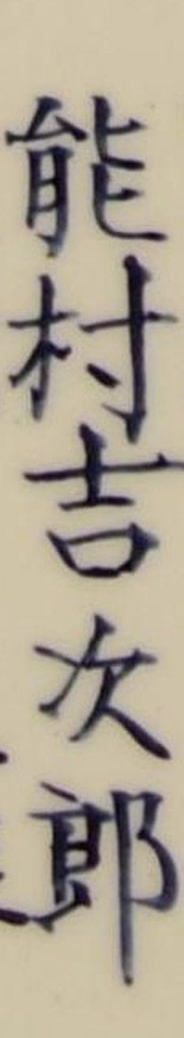能村吉次郎
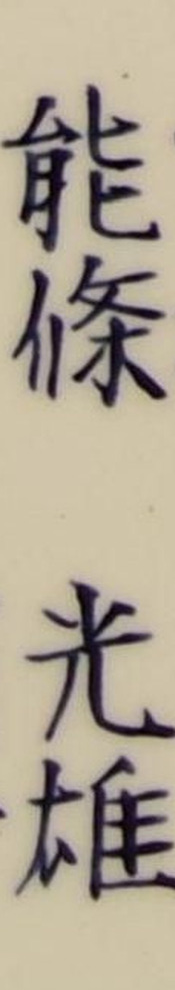能條光雄
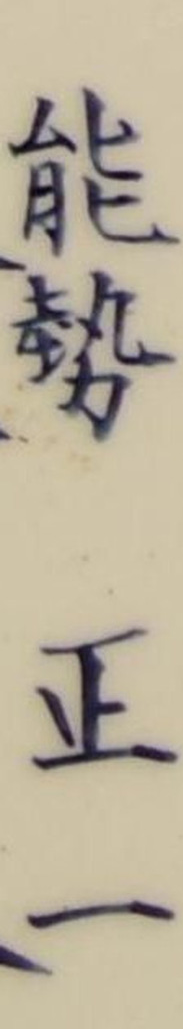能勢正一
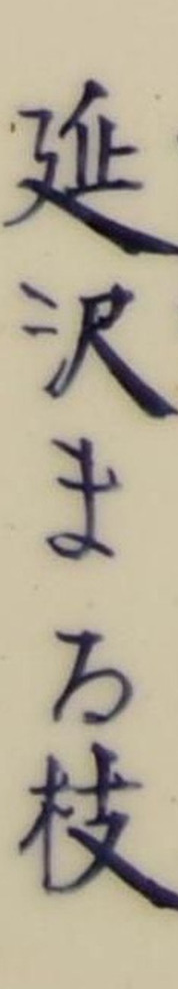延沢まる枝
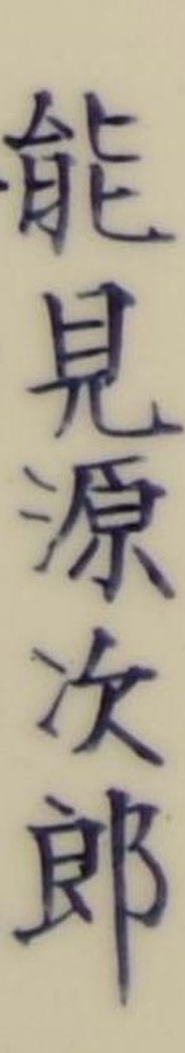能見源次郎
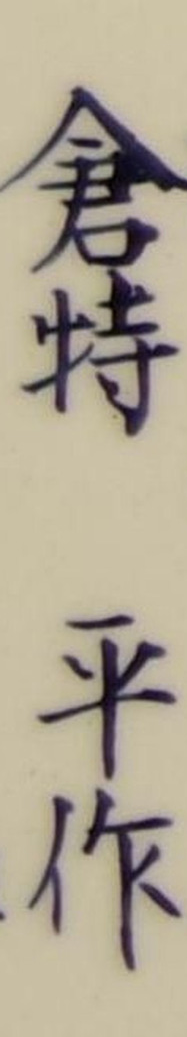倉特平作

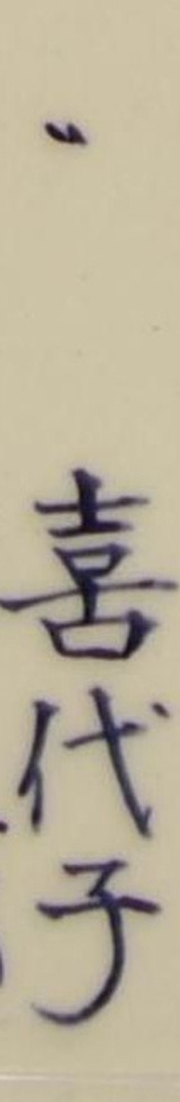喜代子
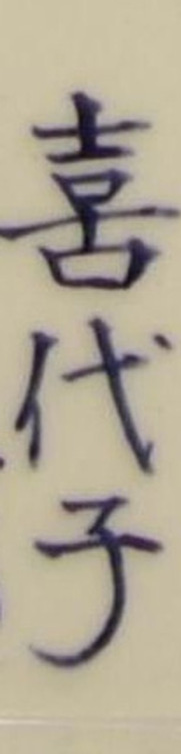喜代子
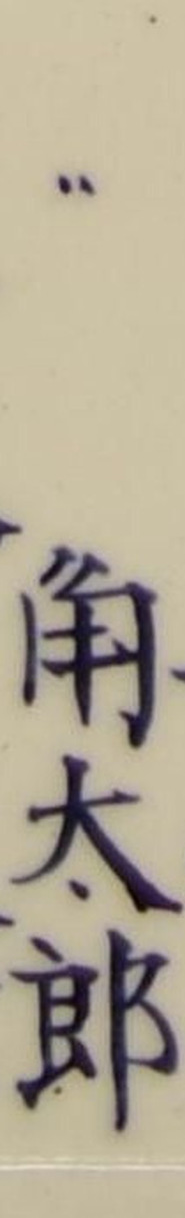角太郎
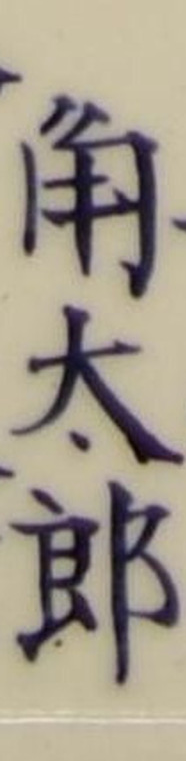角太郎
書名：A~D
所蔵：koyasan kongobuji
